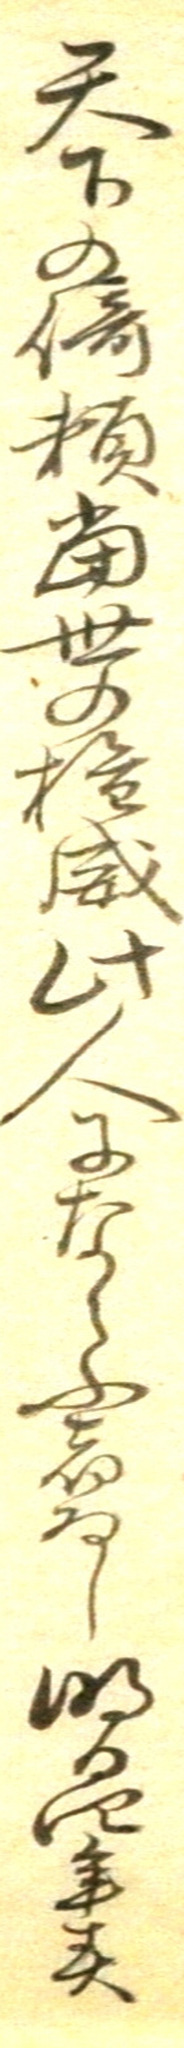天下の倚頼当世の権威此人にならふ者なし明る四年春
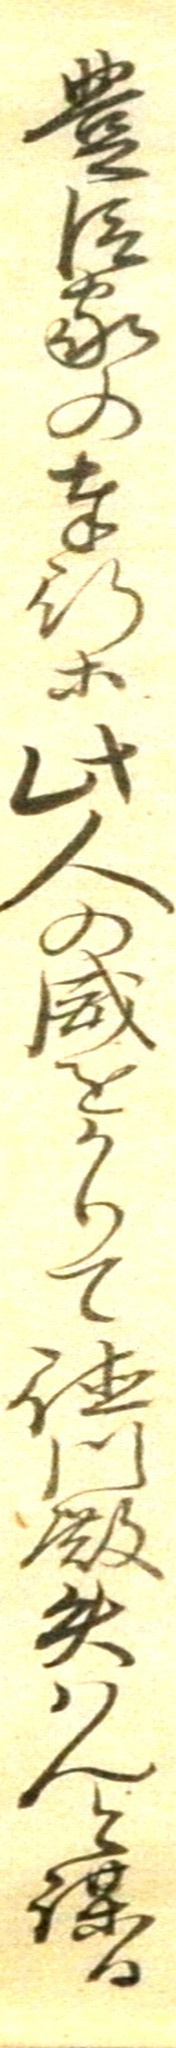豊臣家の奉行等此人の威をかりて徳川殿失はんと謀る
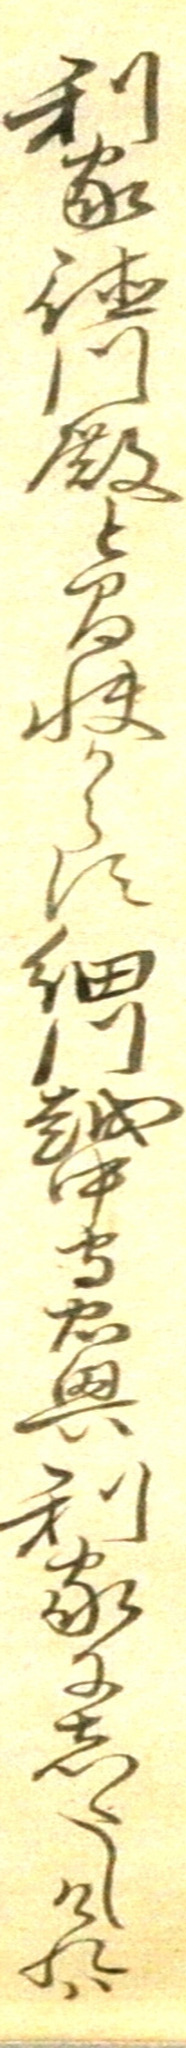利家徳川殿と間快からす細川越中守忠興利家にしたしけれは
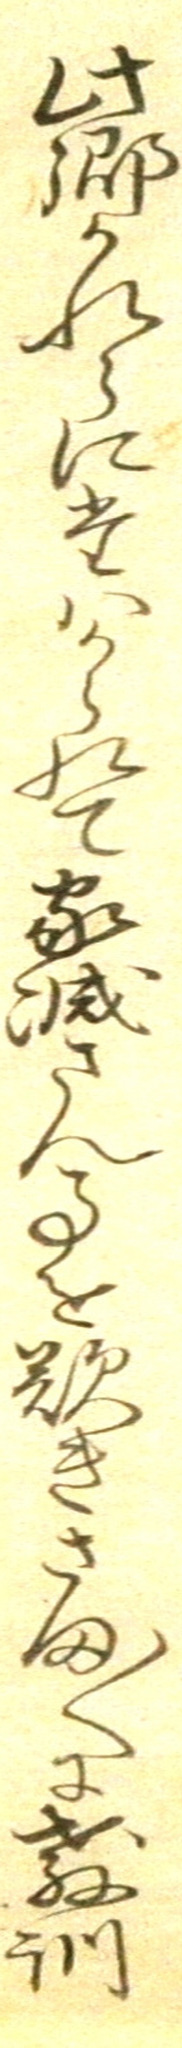氏郷かれらにたはかられて家滅さん事を歎きさま〳〵に教訓
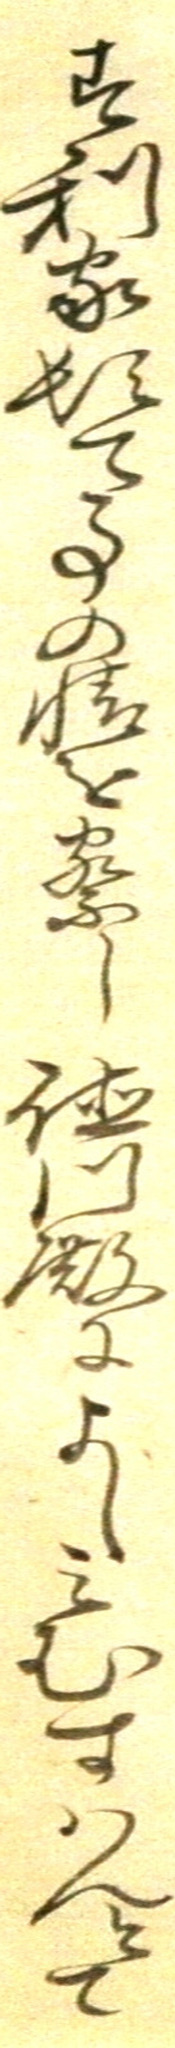す利家頓て事の情を察し徳川殿によしみむすはんとて
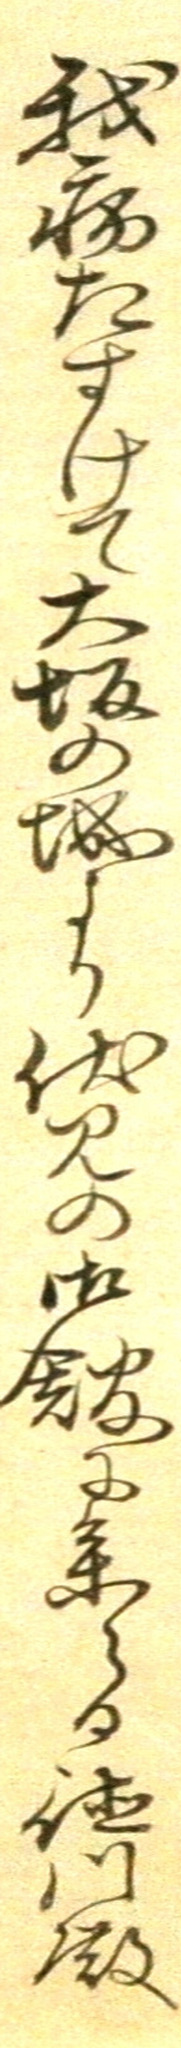我病たすけて大坂の城より伏見の御館に参らる徳川殿
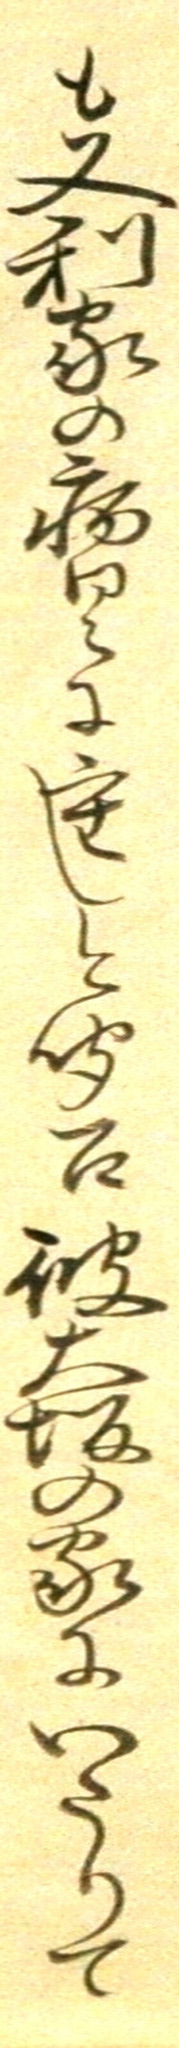も又利家の病日々に重しと聞召彼大坂の家にいたりて
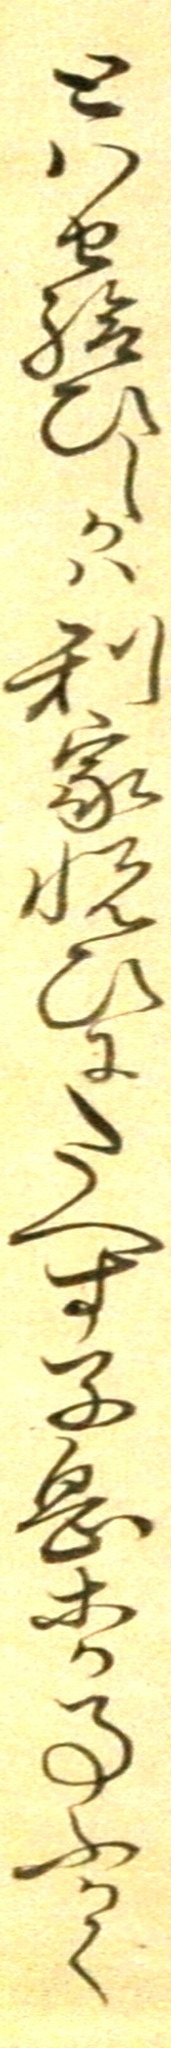とはせ給ひしかは利家悦ひにたへす子息等か事ふかく
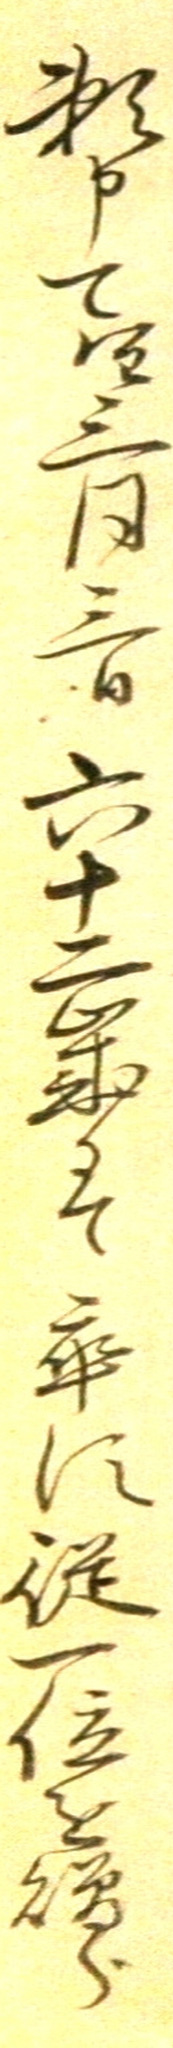頼申て閏三月三日六十二歳にて卒す従一位を贈ら

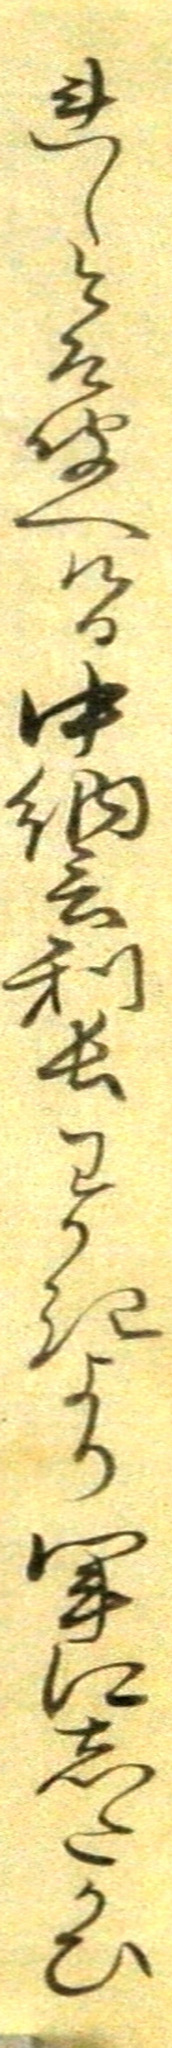れしとそ聞へける中納言利長わかきより軍にしたかひ
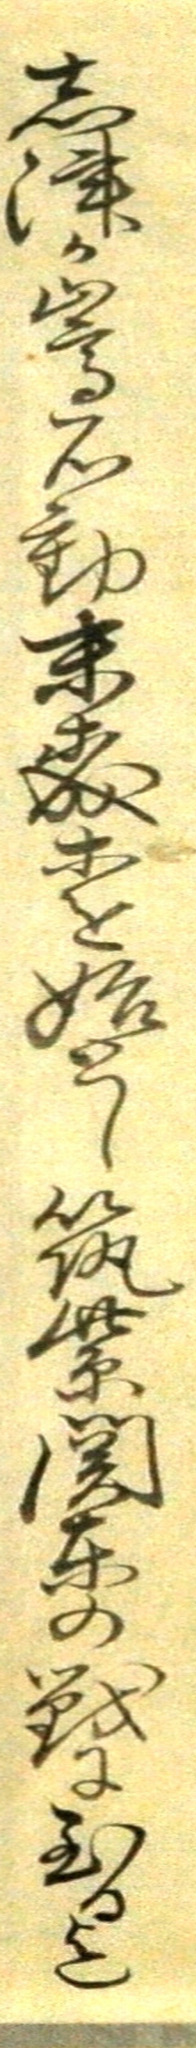志津か嵩石動末森等を始とし筑紫関東の戦に至る迄
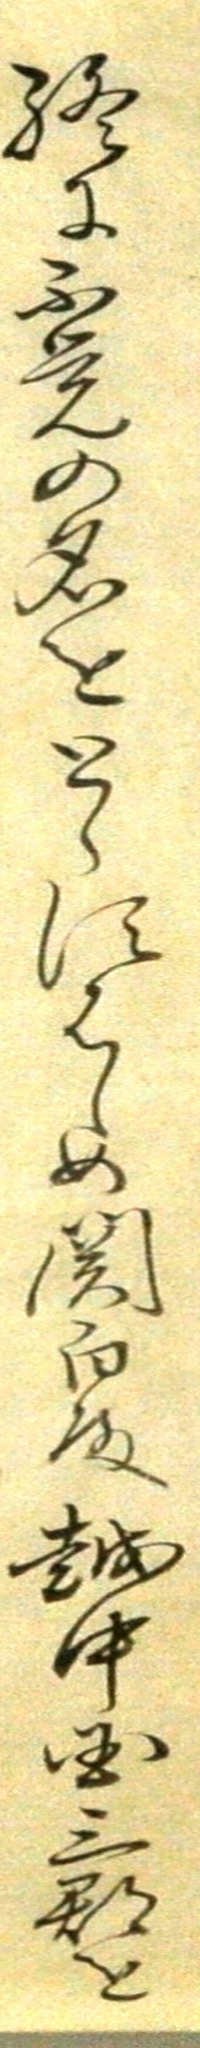終に不覚の名をとらすはしめ関白殿越中国三郡を
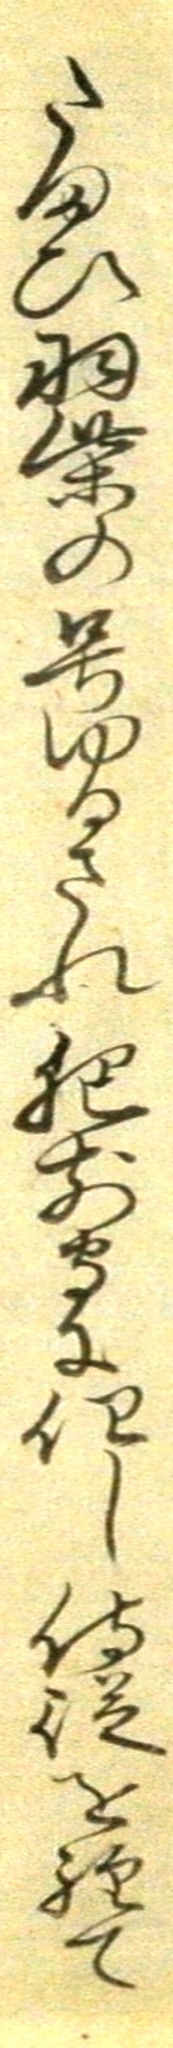たまひ羽柴の号ゆるされ肥前守に任し侍従を経て
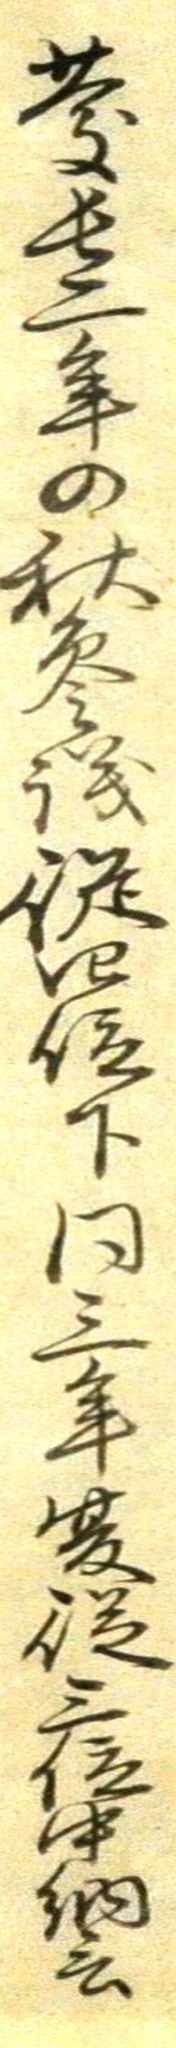慶長二年の秋参議従四位下同三年夏従三位中納言
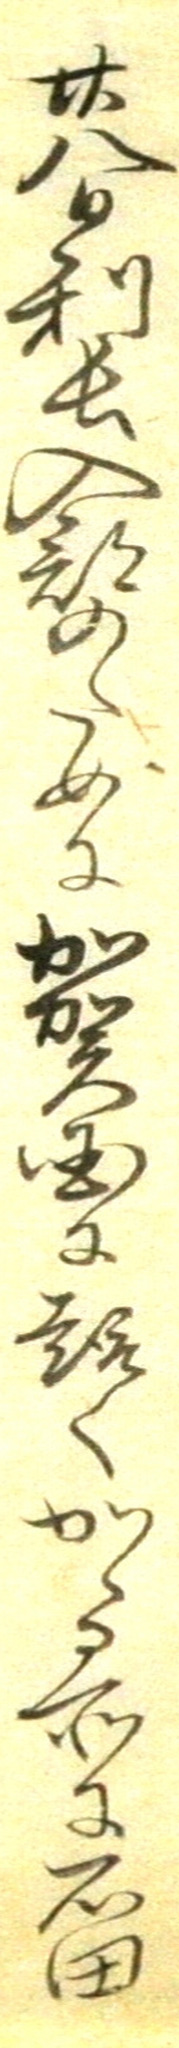廿八日利長入部のために加賀国に趣くかゝる所に石田
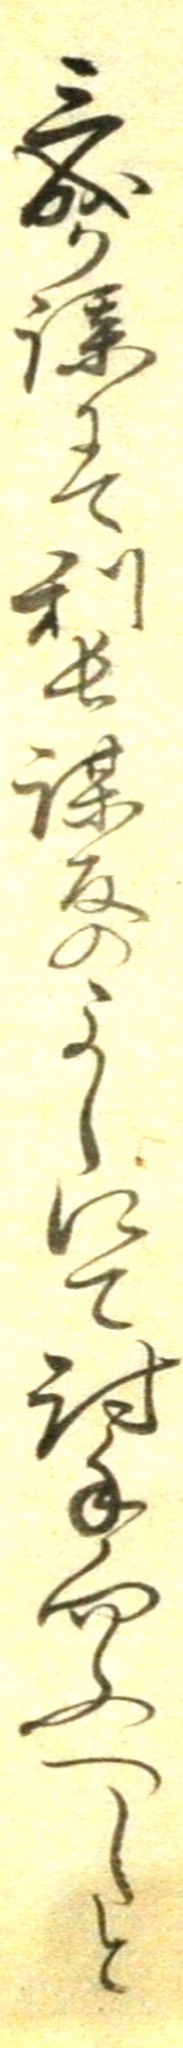三成か謀にて利長謀反のよしにて討手向ふへしと
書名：藩翰譜（七・上）
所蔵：伊那市立高遠町図書館・合同会社AMANE
